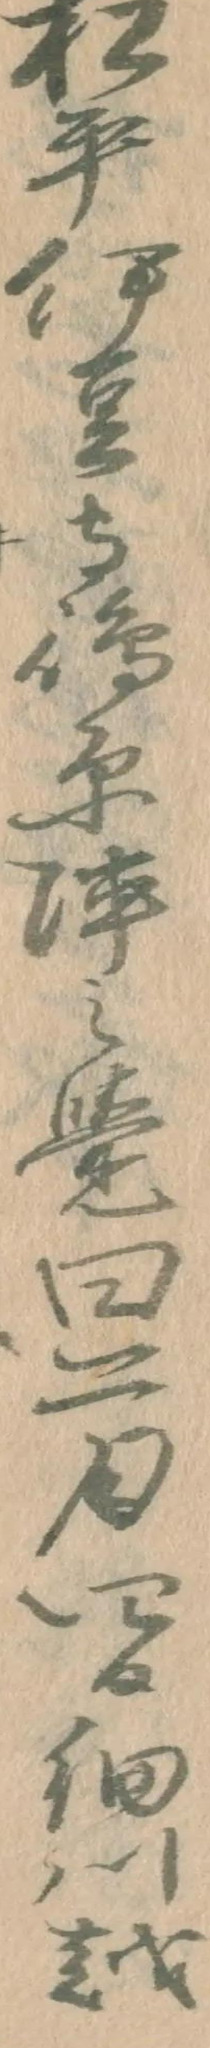松平伊豆守島原陣之覚曰二月四日細川越
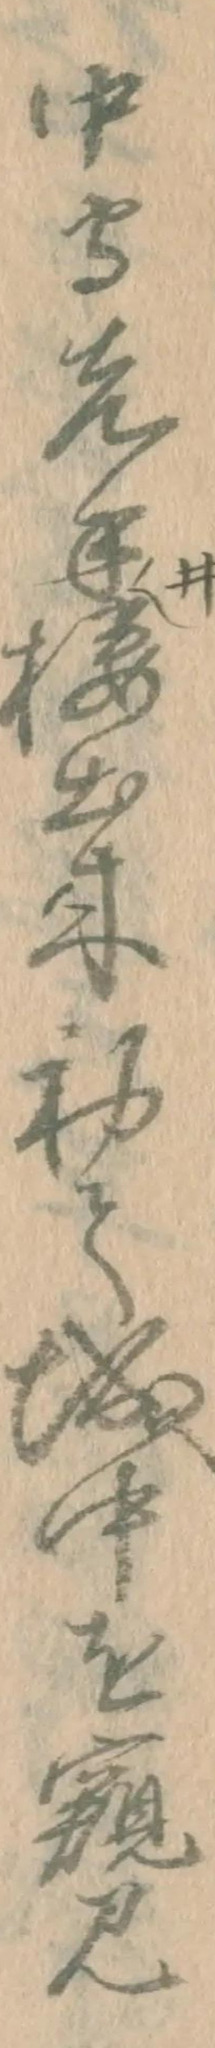中守先手井樓出来初て城中を窺見

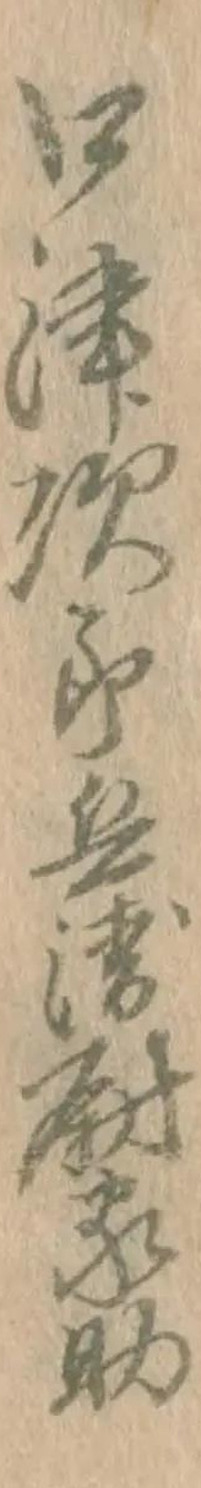口津次兵衛尉頼助
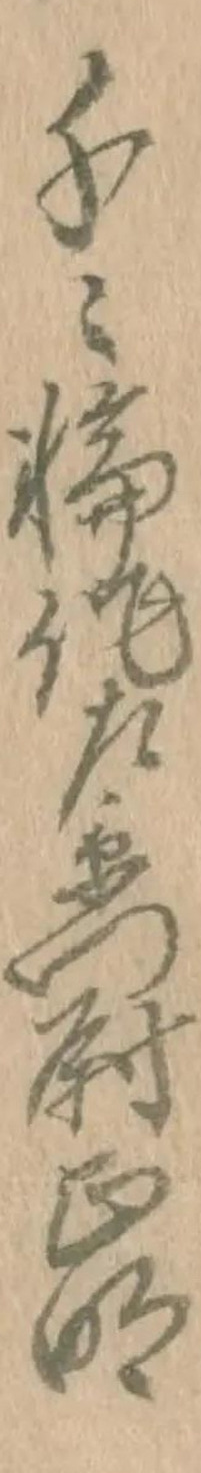千々輪作左衛門尉正明
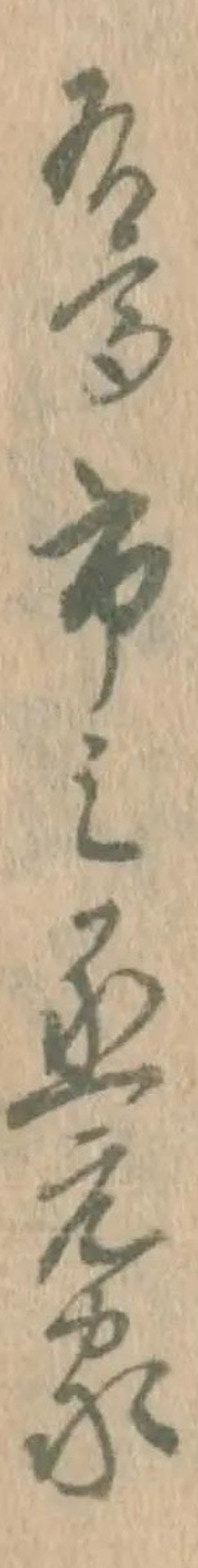有馬市之丞元家
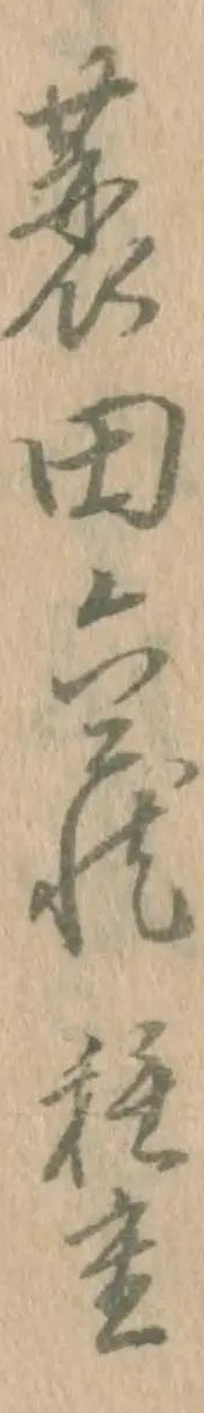蓑田六蔵種重
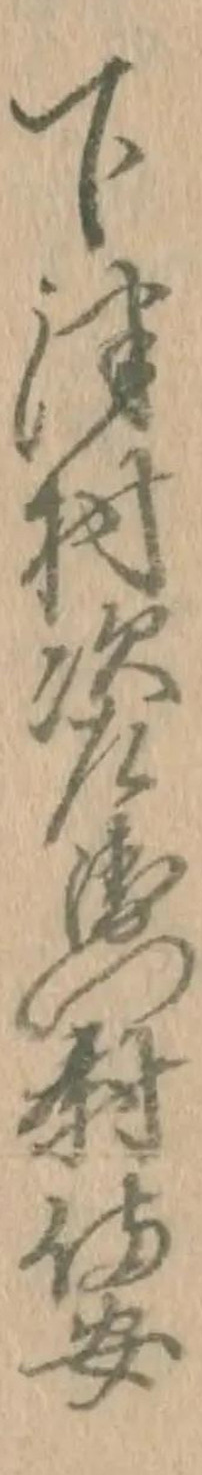下津村次左衛門尉備安
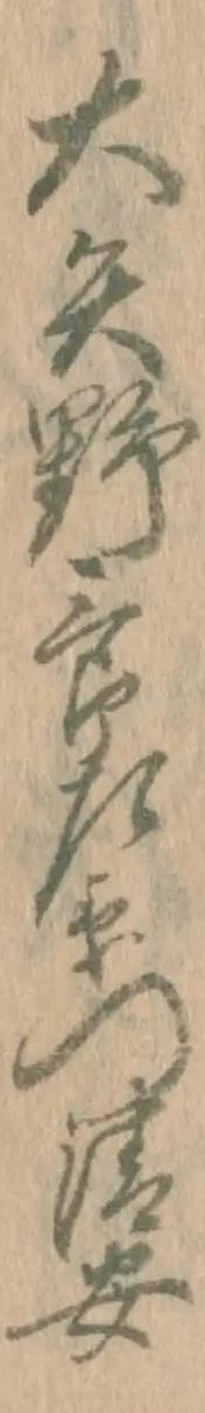大矢野三郎左衛門清安
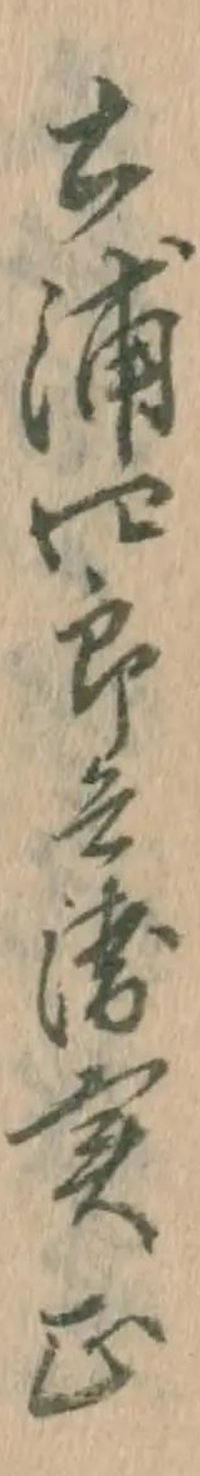土浦四郎兵衛実正
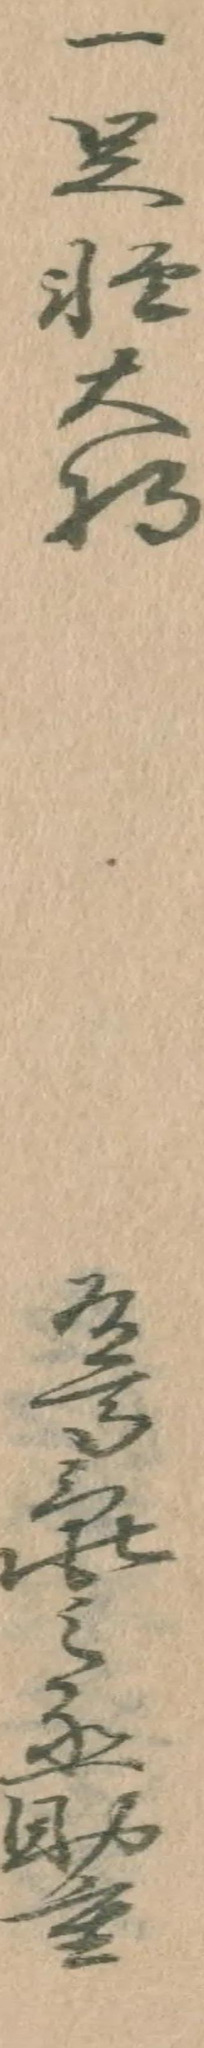一足軽大将有馬亀之丞助重
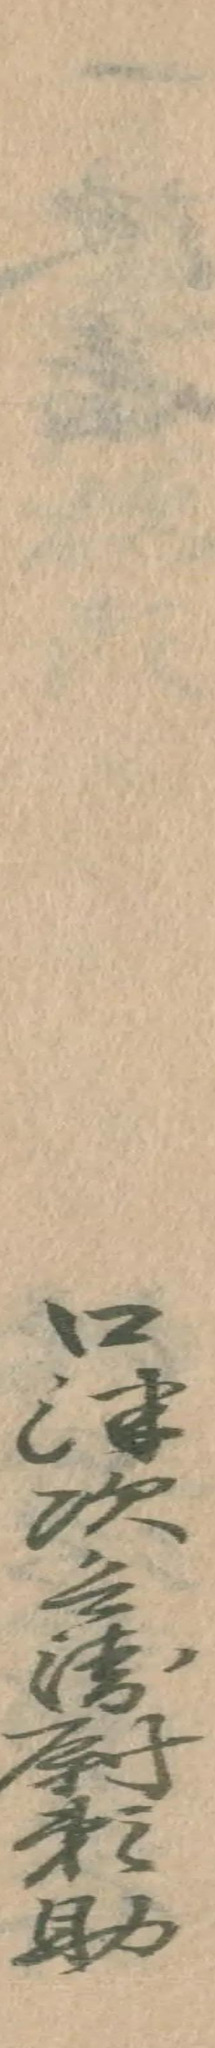口津次兵衛尉頼助
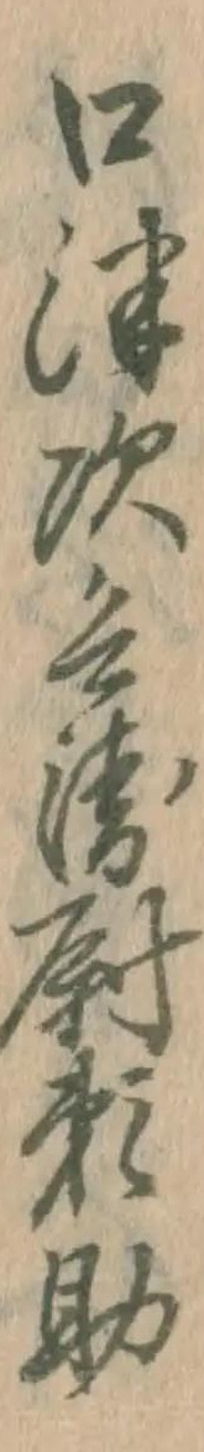口津次兵衛尉頼助
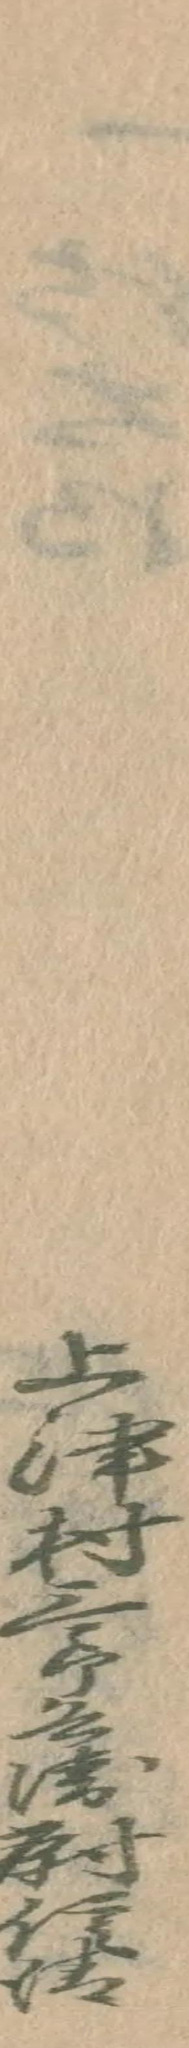上津村三郎兵衛尉信清
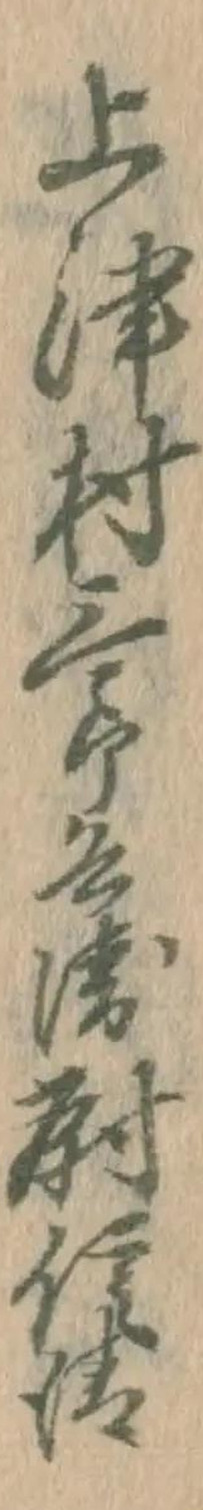上津村三郎兵衛尉信清
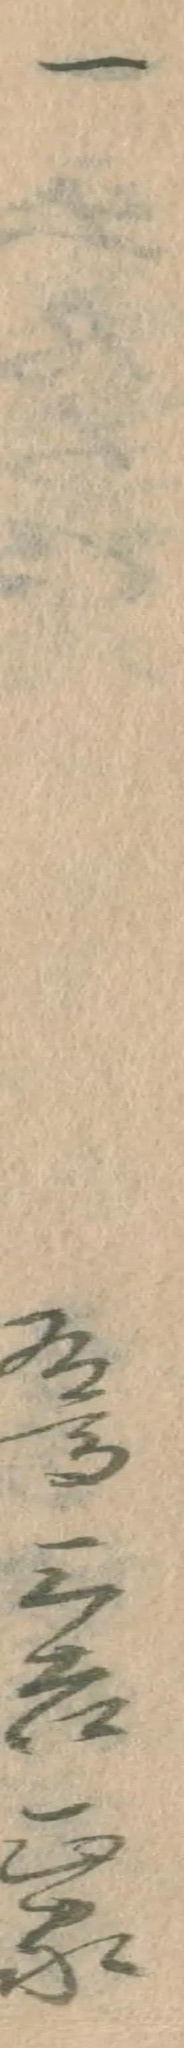一有馬三吉正家
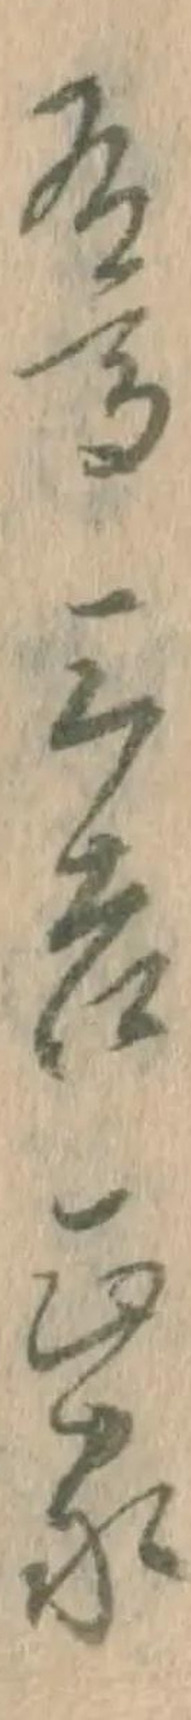一有馬三吉正家
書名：切支丹御退治記 49巻. [6]
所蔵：国立国会図書館 National Diet Library, JAPAN
